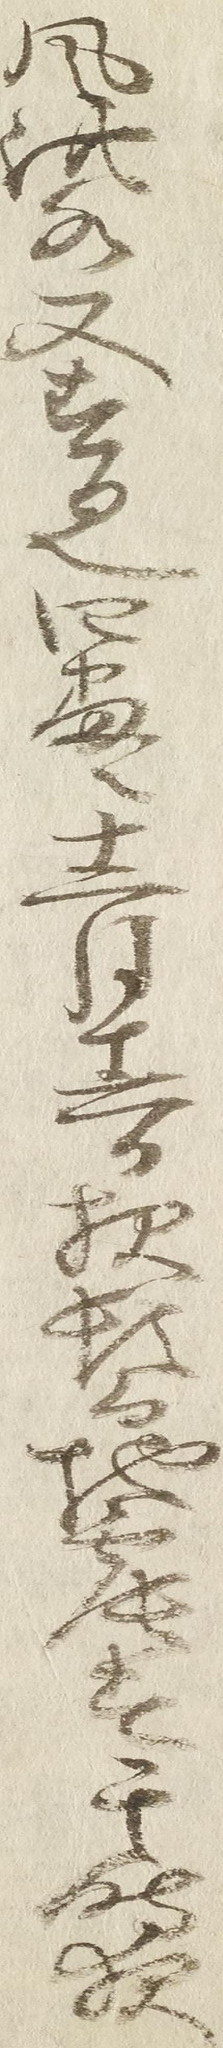風洪水又する也四番に十二月十六日夜頓而地震にて干時夜
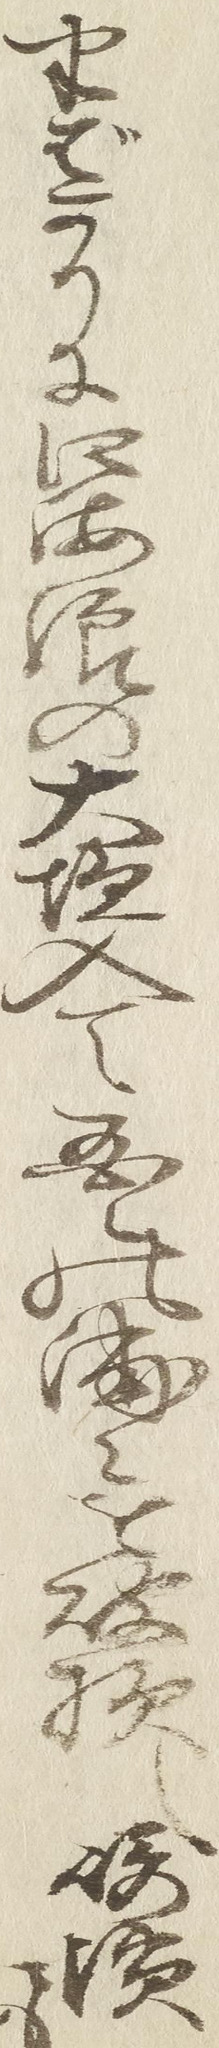半ばかりに四海浪の大塩入て国々の浦々を破損し崎浜にも
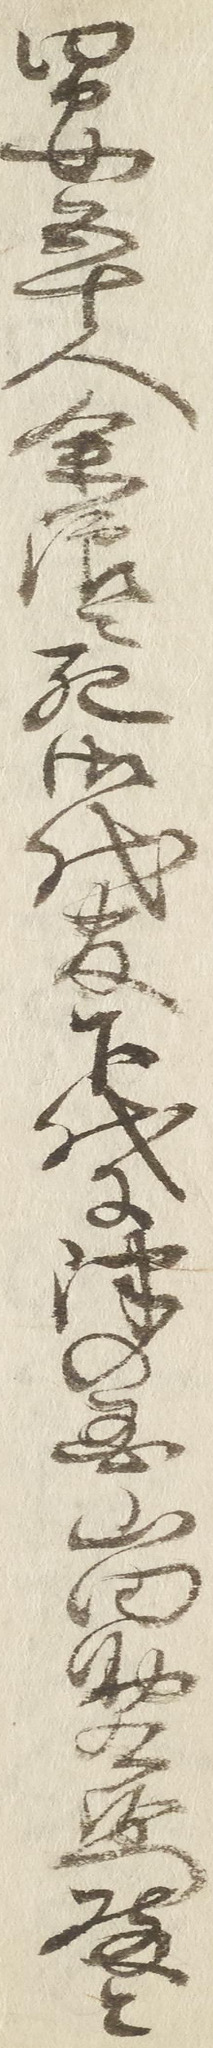男女五十人余浪に死御代官下代に津の国山田助右衛門殿と
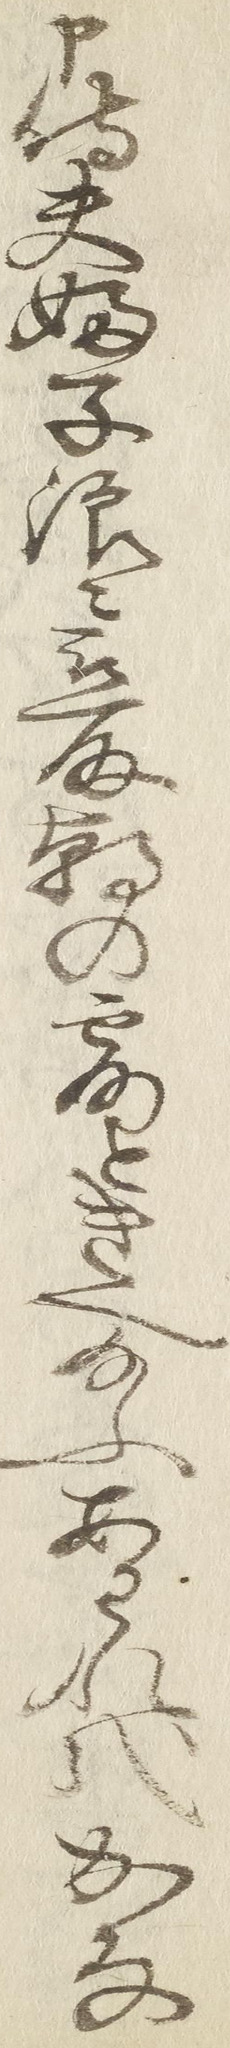申侍夫婦子浪に被取朝の露ときへ給ふあわれ哉かな
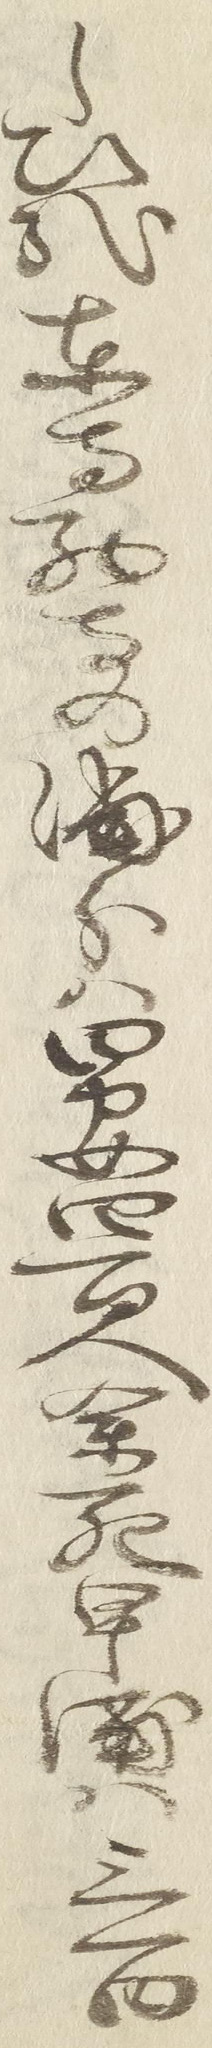しひ哉東寺西寺の浦分は男女四百人余死甲浦は三百
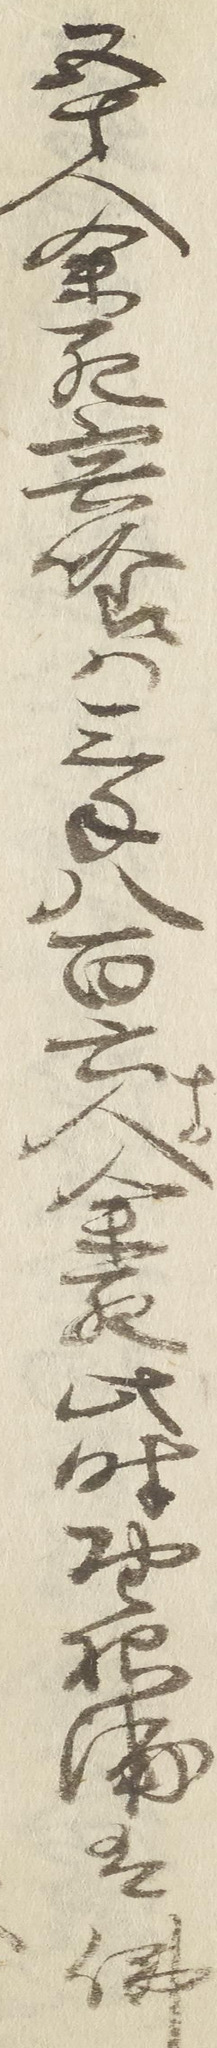五十人余宍喰は三千八百六十人余死此時野根浦は佛
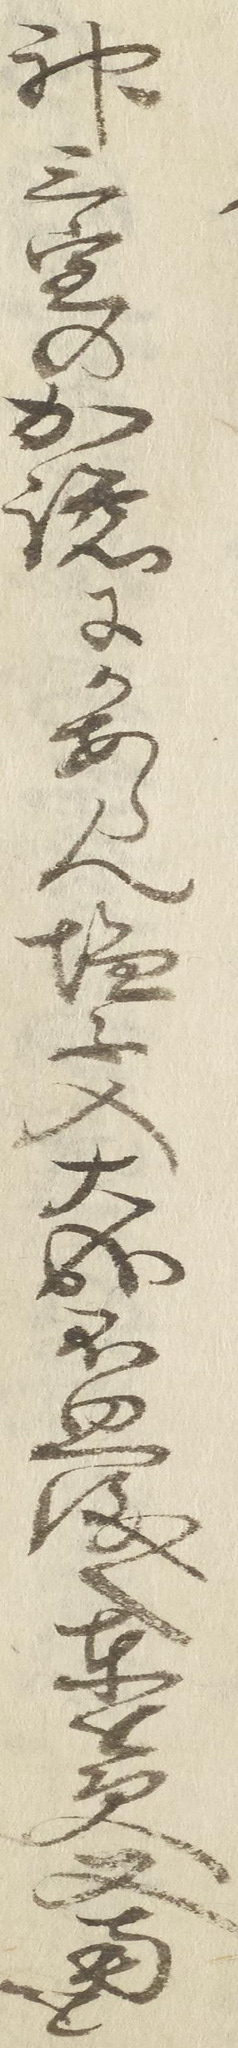神三宝の加護にかあらん塩不入大成不思議也東を受又南を
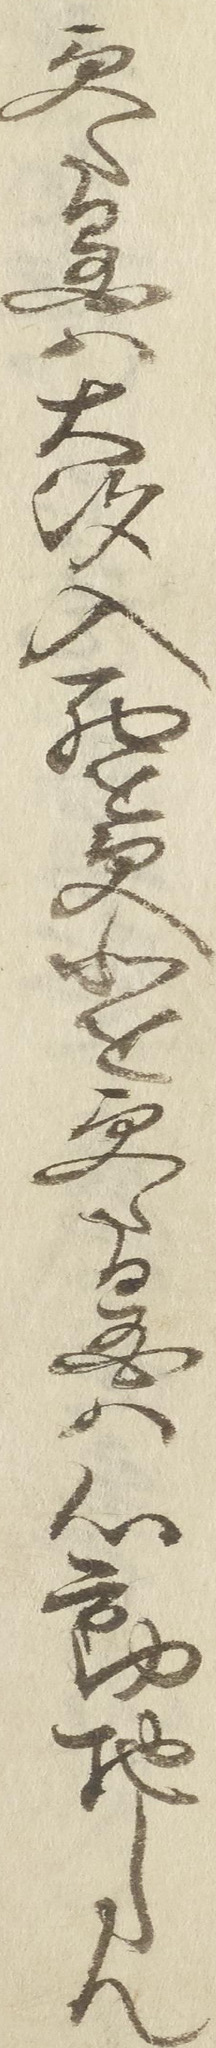受たる国は大汐入西を受北を受たる国は心動地しん

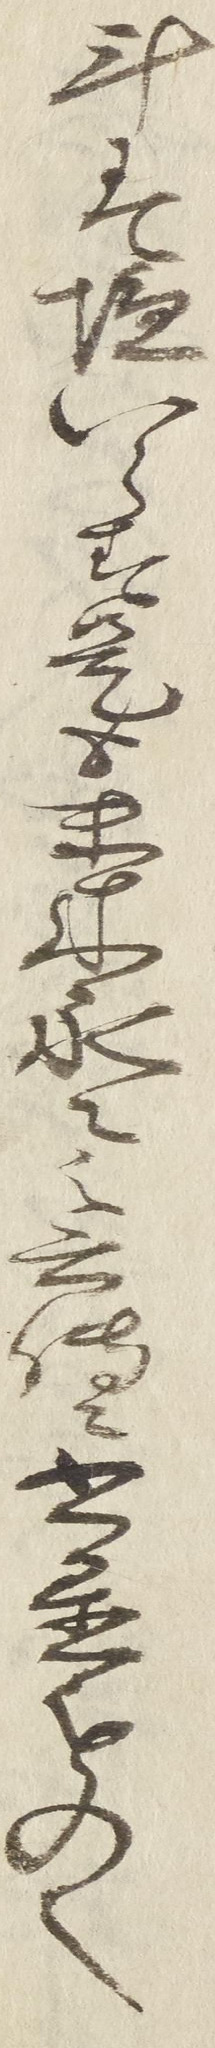斗にて塩いらす是も未来永々之云伝二書置もの也
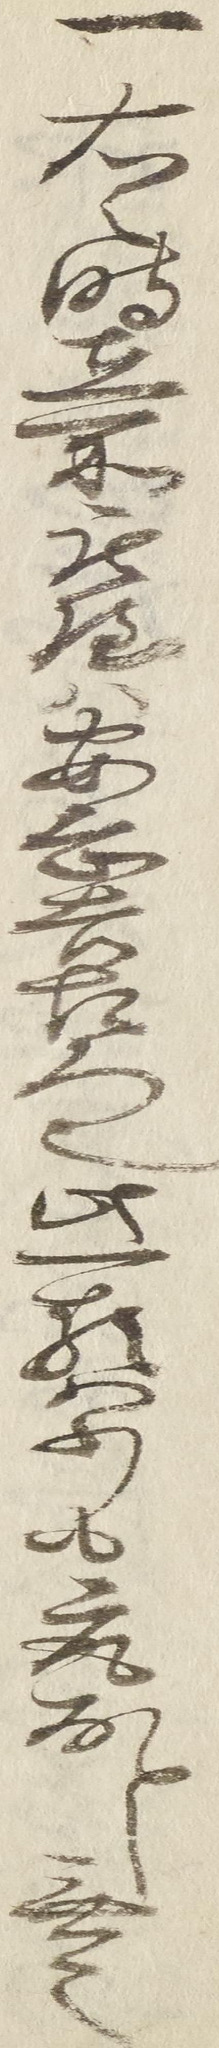一右之時在所庄屋は安岡吉左衛門也此一類は少も取おとし無之
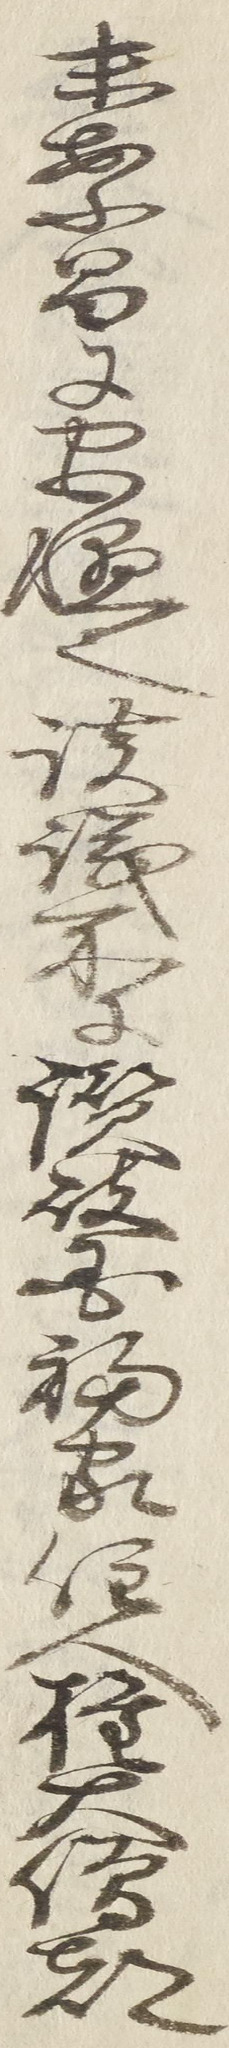未あふ昌に安穏也談議所に讃岐国福家住人権大僧都
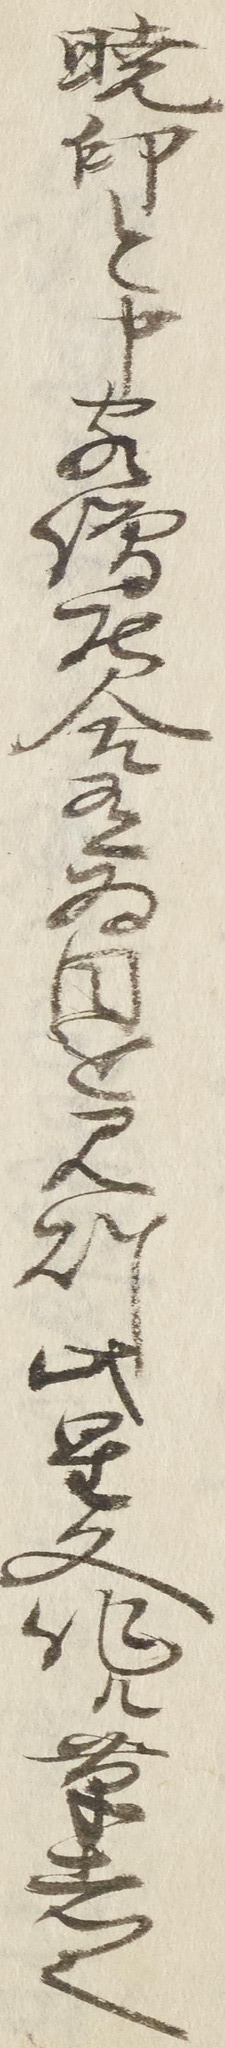暁印と申客僧居会有為目を見則此星文作ㇽ筆者也
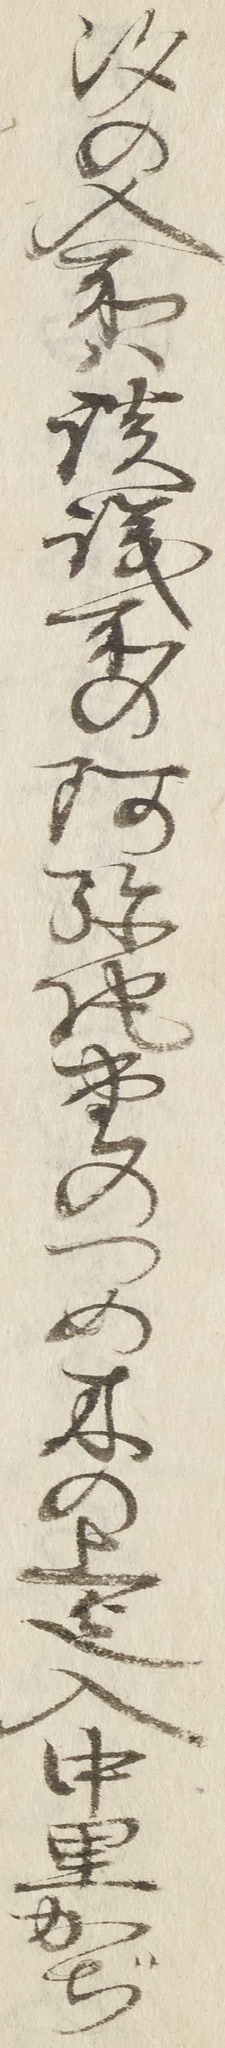汐の入所は談議所阿弥陀堂のつめ木の上迄入中里かぢ
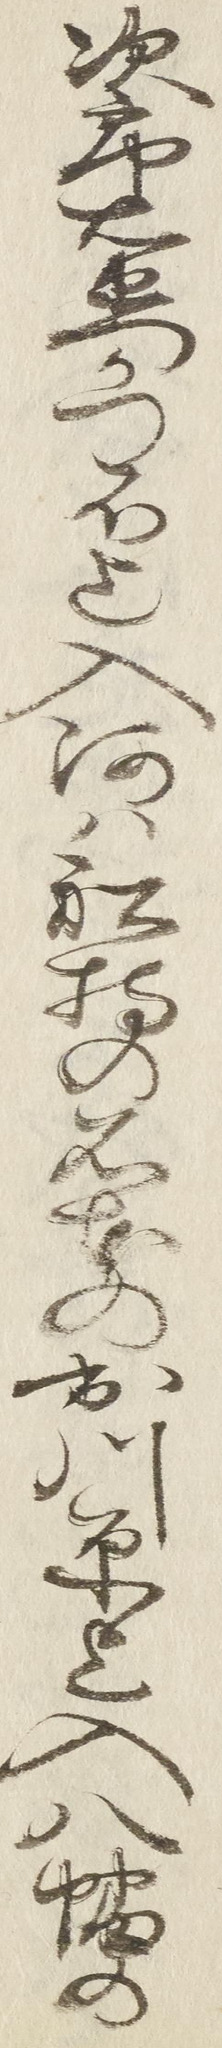次郎右衛門かつほ迄入河は船持の名花の出川原迄入八幡の
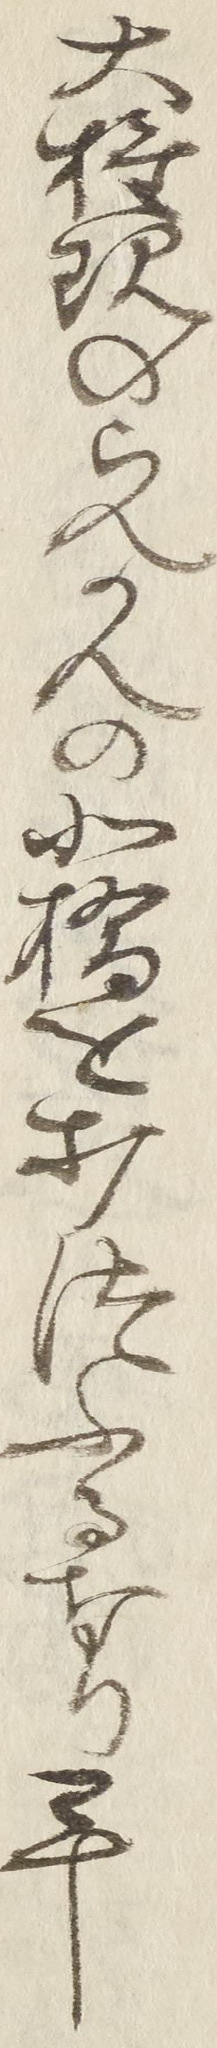大権現のらんかんの北橋を打つふるなり畢
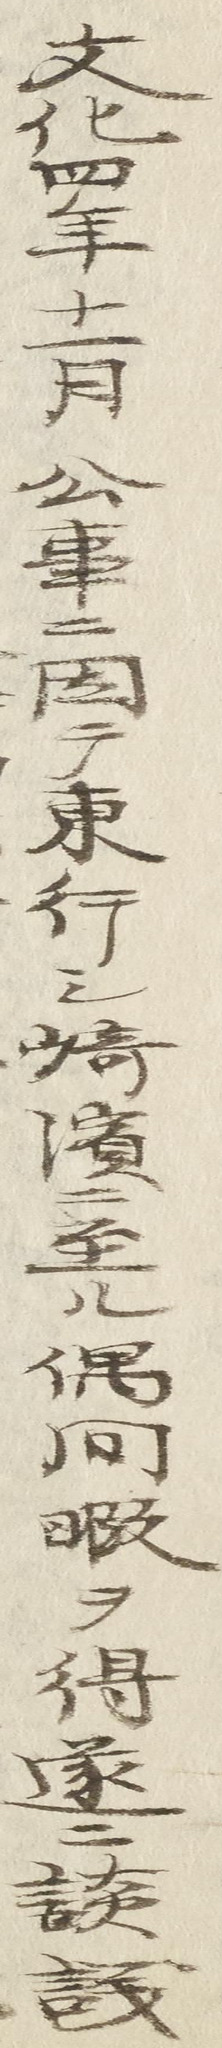文化四年十一月公事に因て東行し崎浜に至る偶間暇を得遂に談議
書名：地震記　下
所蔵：東京大学地震研究所図書室 Earthquake Research Institute Library, The University of Tokyo, JAPAN
